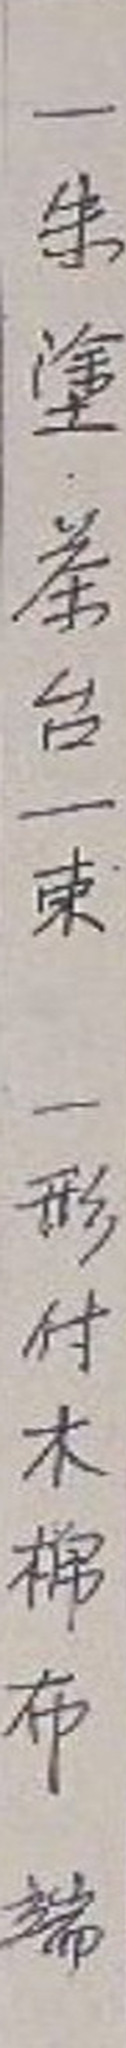一朱塗茶台一束一形付木棉布端
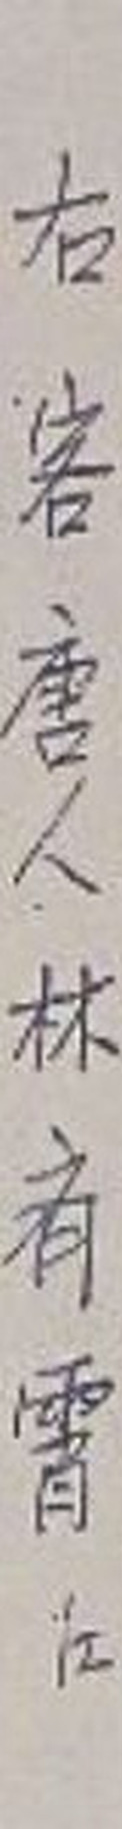右客唐人林斉霄え
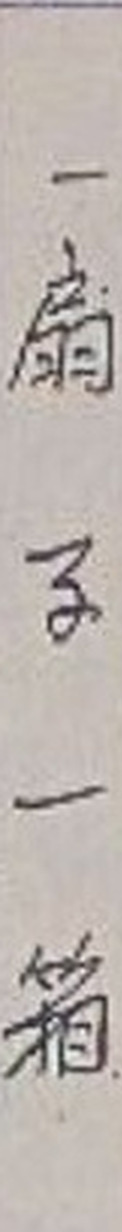一扇子一箱一手拭一筋
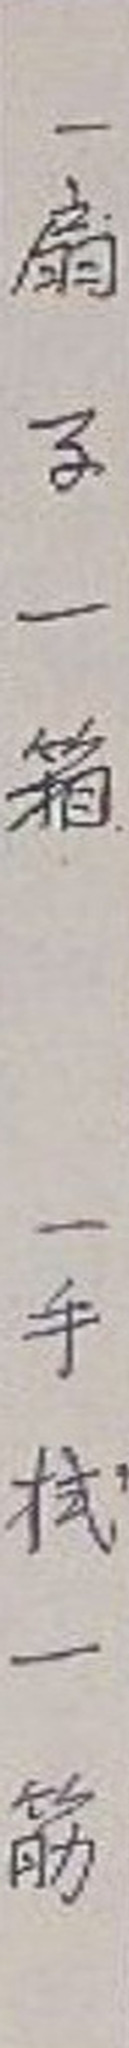一扇子一箱一手拭一筋
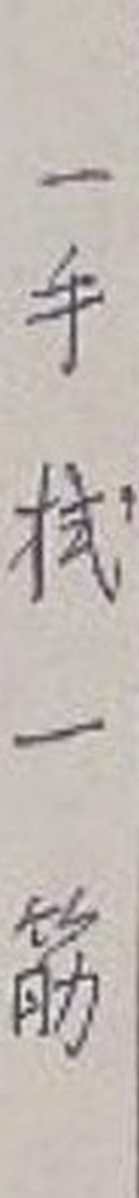一扇子一箱一手拭一筋
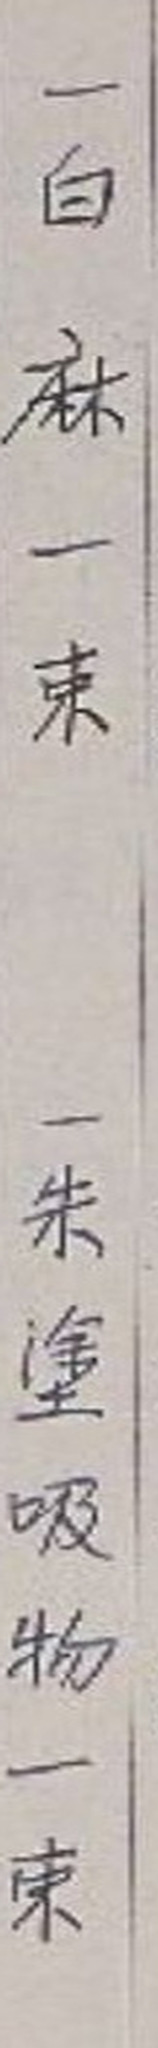一白麻一束一朱塗吸物一束
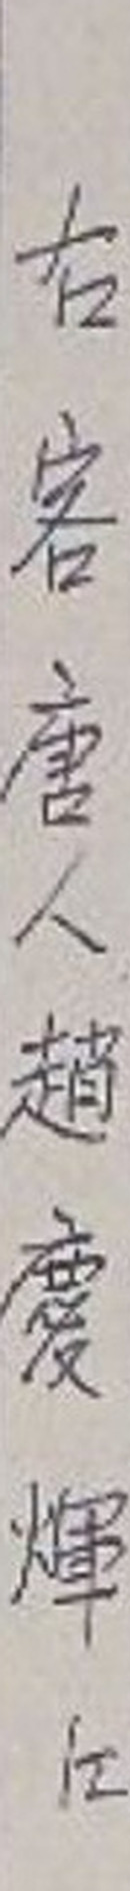右客唐人趙慶煇え
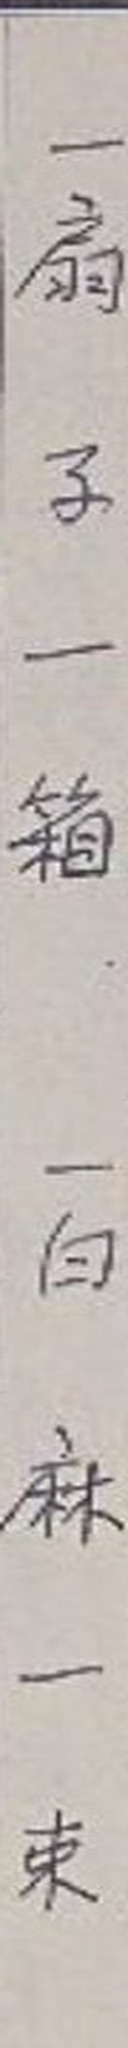一扇子一箱一白麻一束
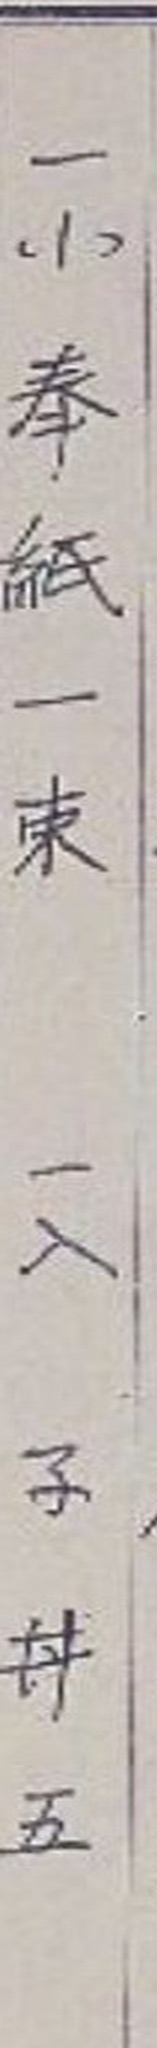一小奉紙一束一入子丼五
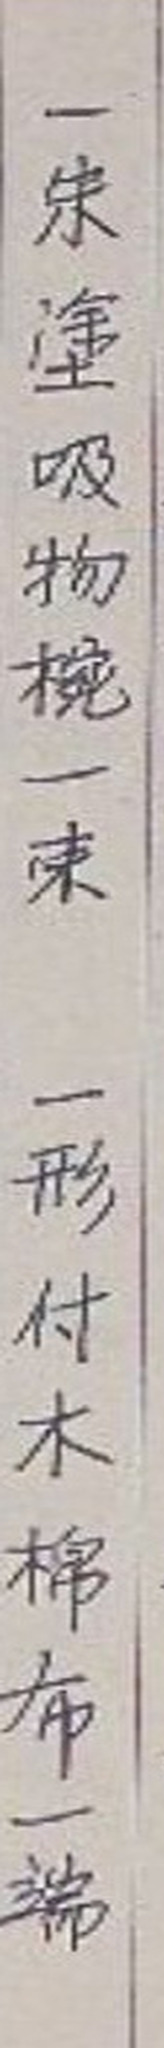一朱塗吸物椀一束一形付木棉布一端
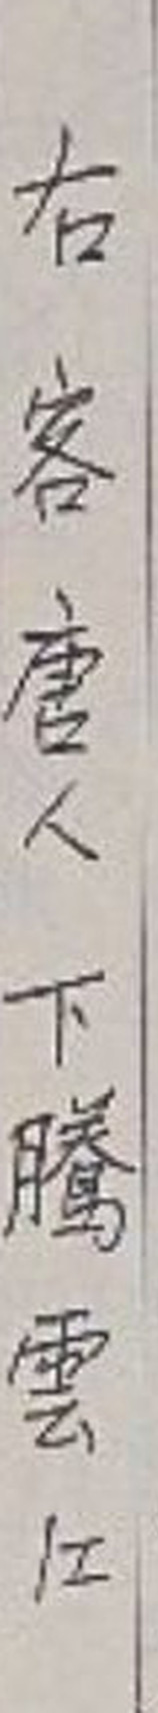右客唐人下騰雲え
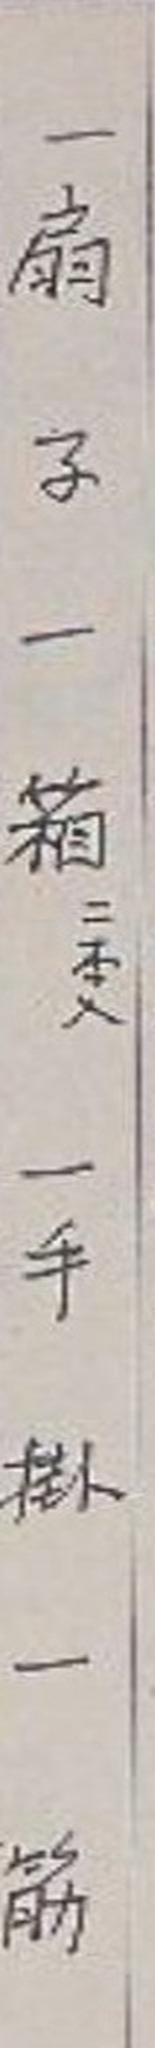一扇子一箱二本入一手掛一筋
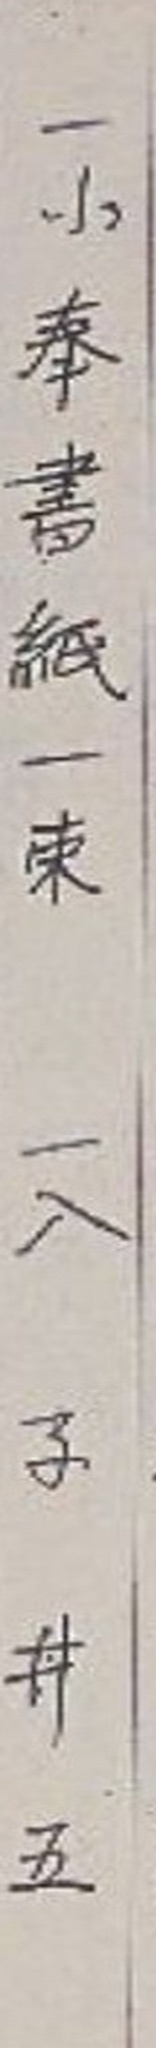一小奉書紙一束一入子丼五
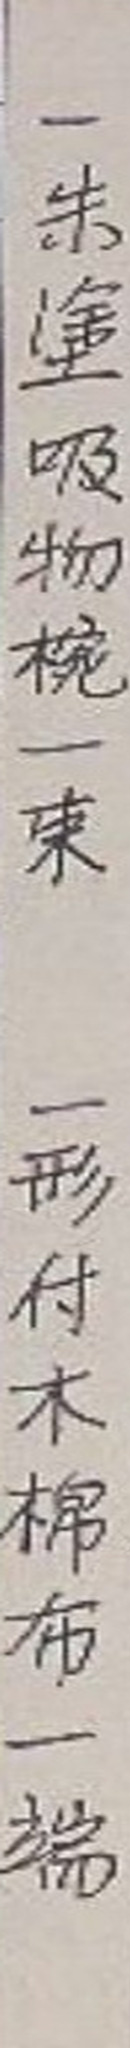一朱塗吸物椀一束一形付木棉布一端
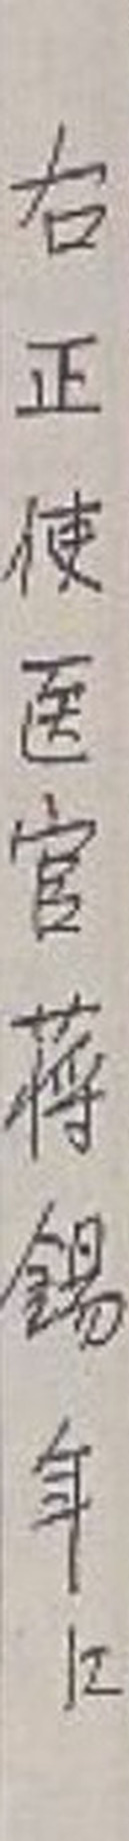右正使医官䉃錫年え
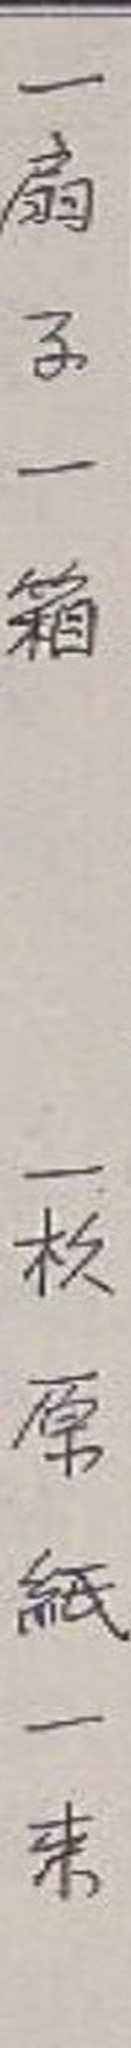一扇子一箱一杉原紙一束
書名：支那冊封使来琉諸記 下巻
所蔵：University of the Ryukyus Library
